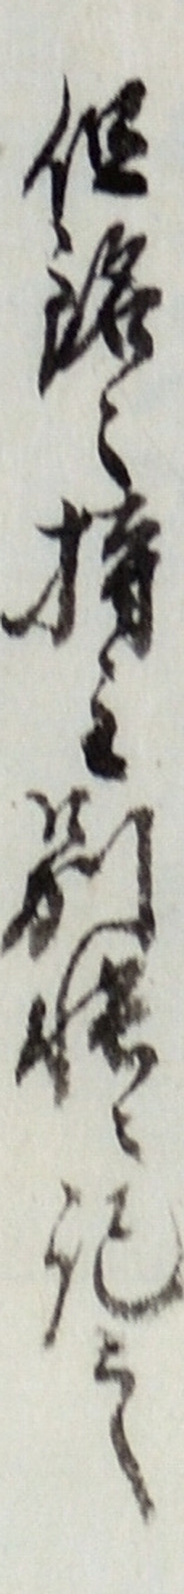但銘々持主別帳ニ記之
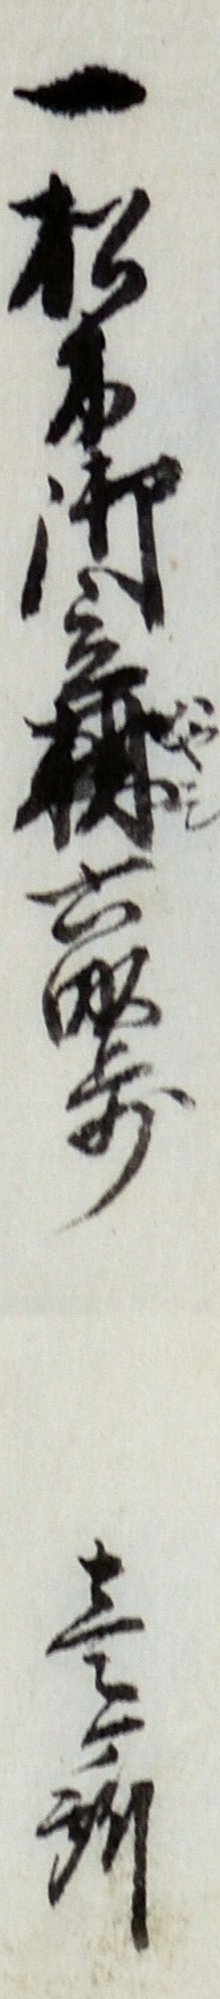一雑木御立林壱反五畝歩壱ヶ所
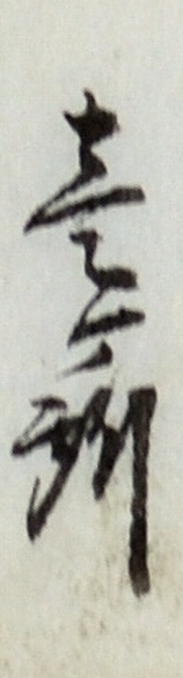壱ヶ所
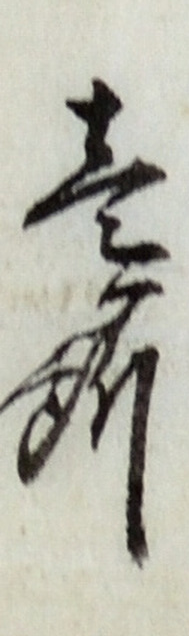壱ヶ所
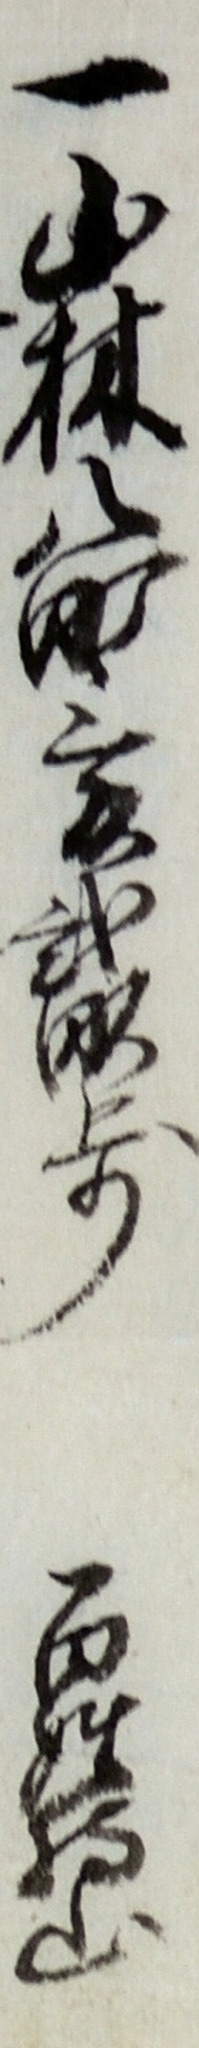一山林八町二反弐畝歩百姓持山
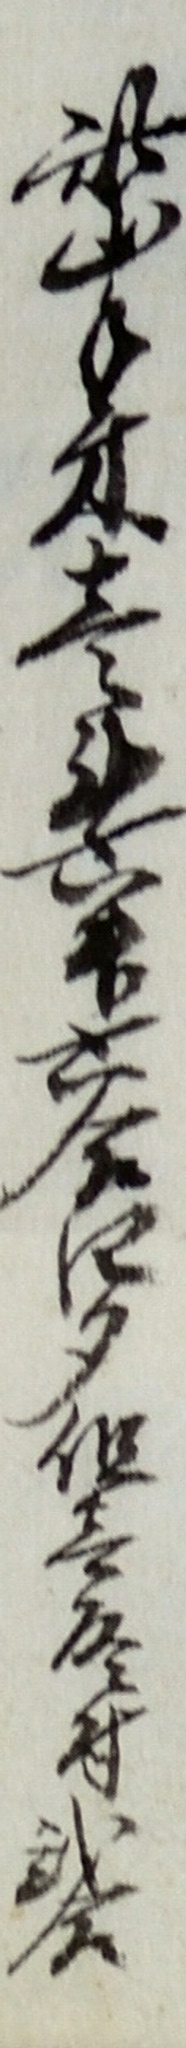此山手米壱斗六升六合四夕但壱反ニ付弐合

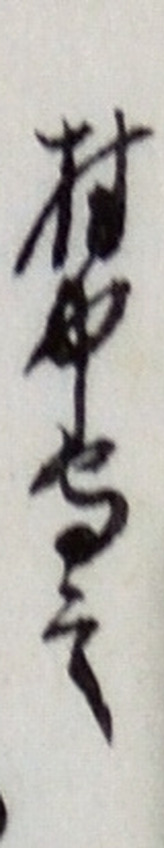村中守之
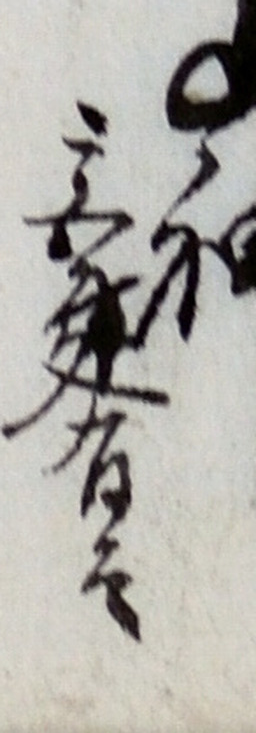宮建有之
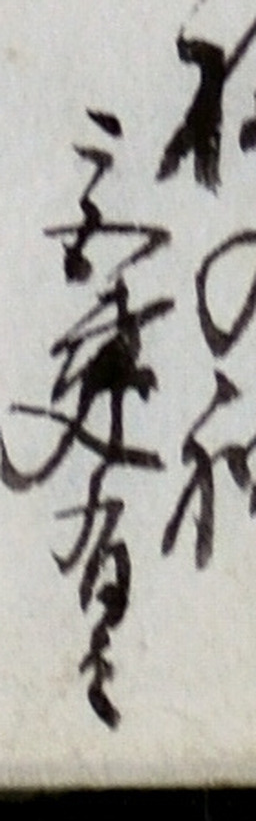宮建有之
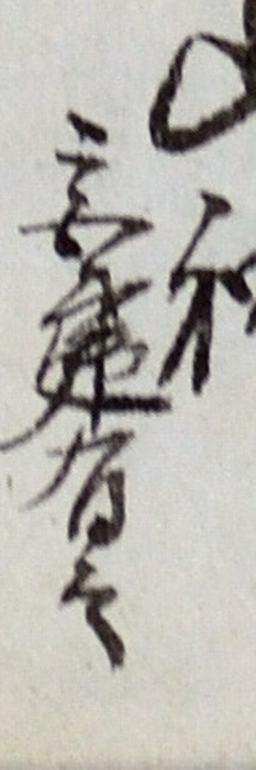宮建有之
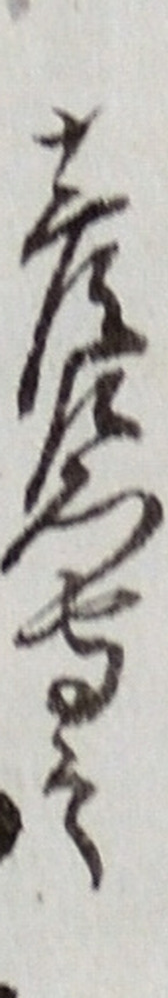彦左衛門守之
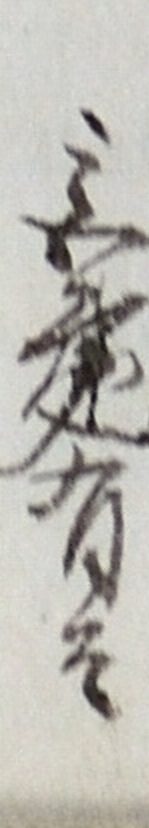宮建有之
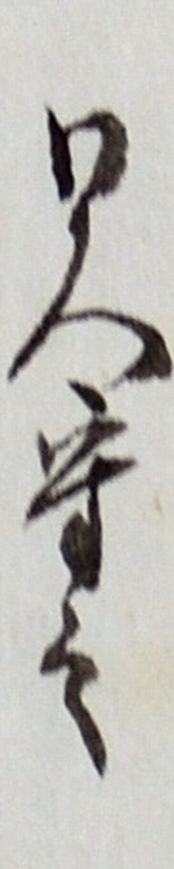同人守之
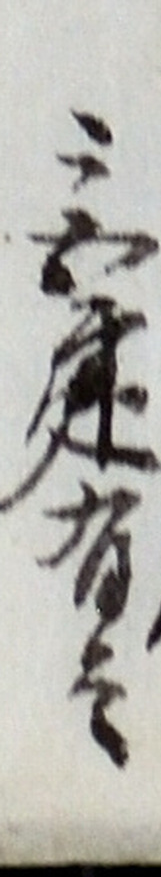宮建有之
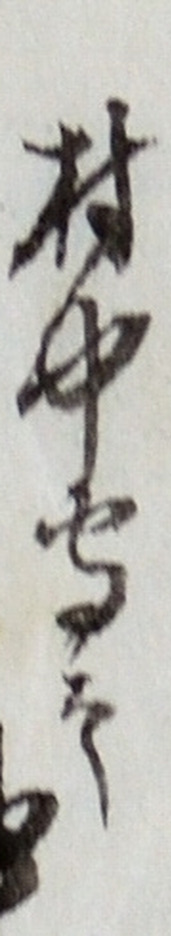村中守之
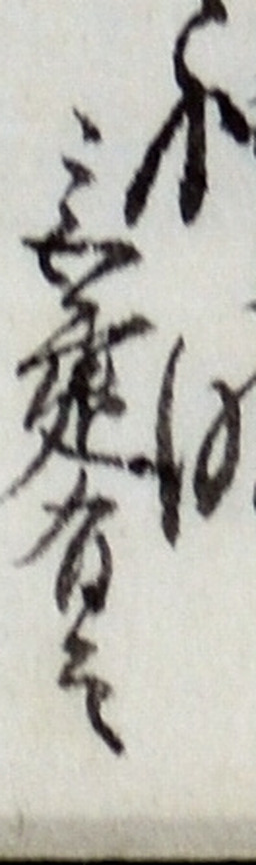宮建有之
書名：御領分中山林社地手控
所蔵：伊那市立高遠町図書館・合同会社AMANE
